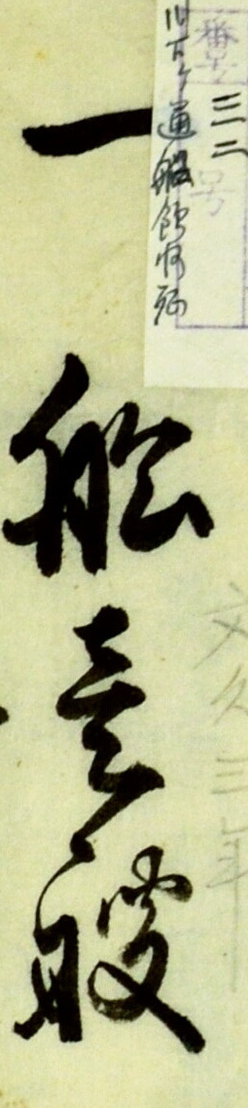一舩壱艘
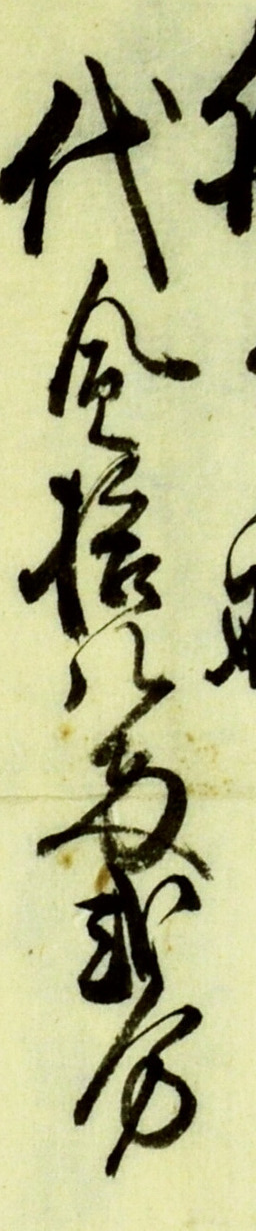代金拾八両弍分
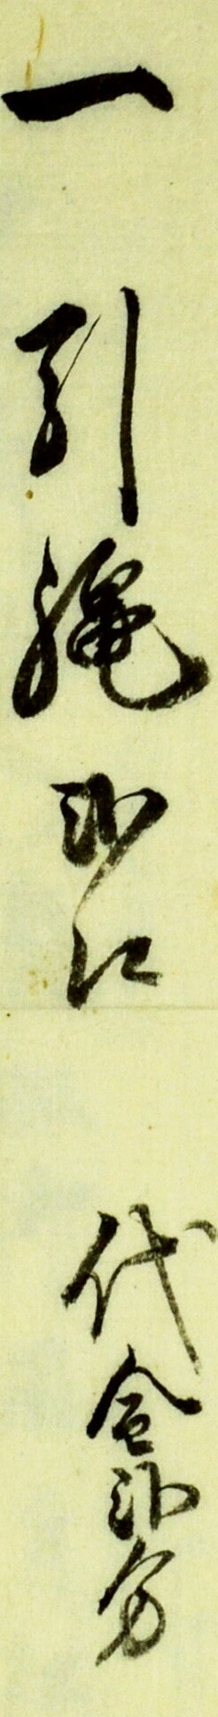一引縄弍口代金弍分
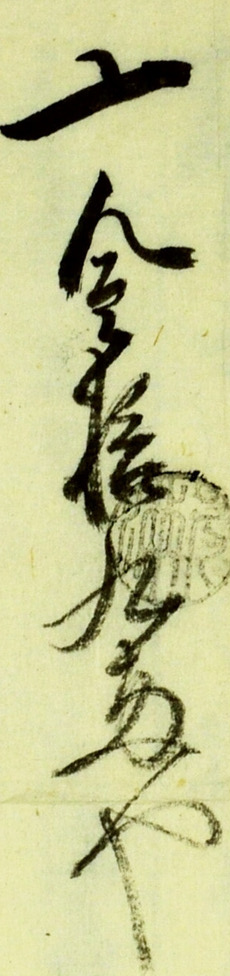〆拾九両也
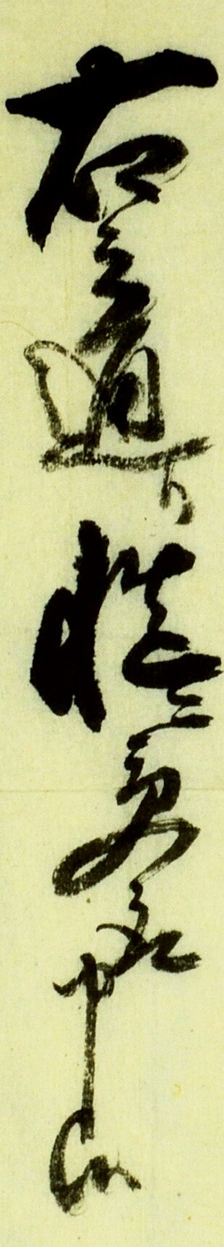右之通り慥ニ受取申候
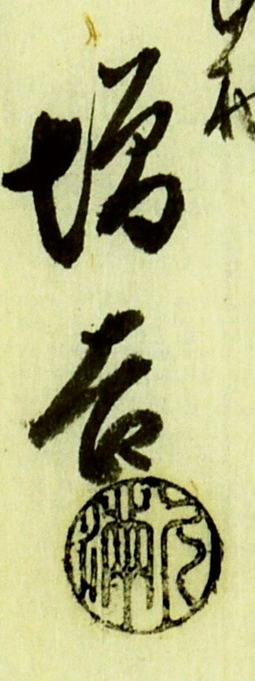増吉印

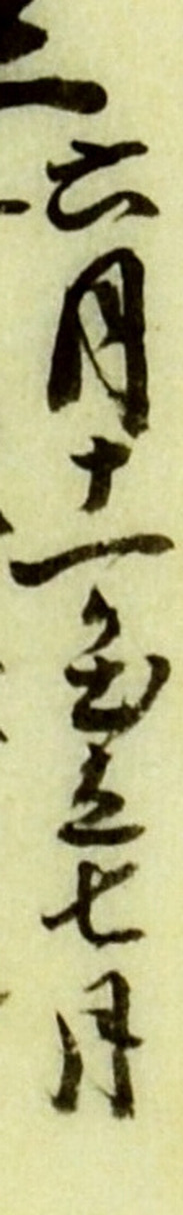六月十一日出立七月
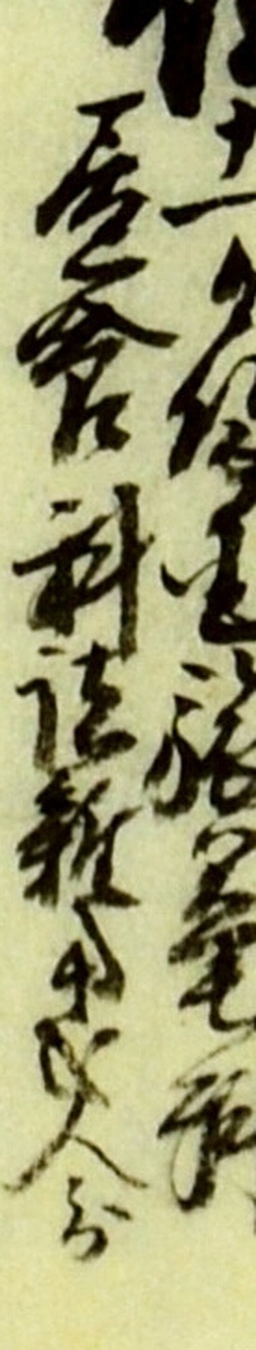昼食料諸雑用弐人分
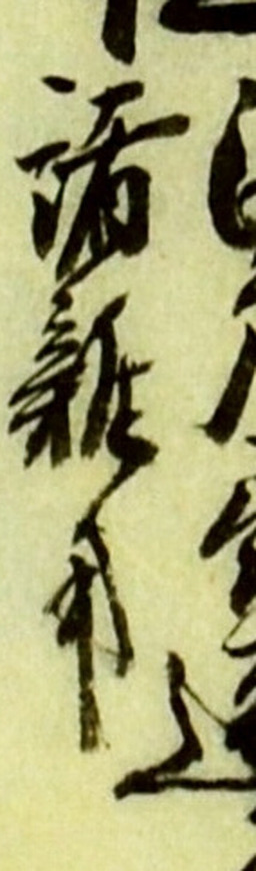諸雑用
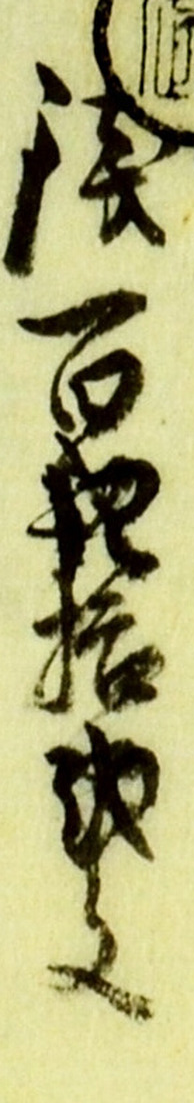銭百弐拾弐文
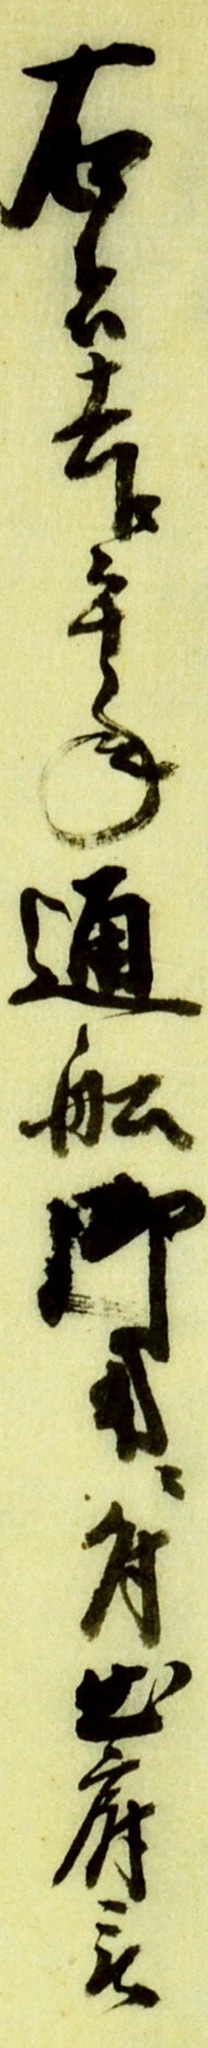右者去ル午年通船御用ニ付出府被
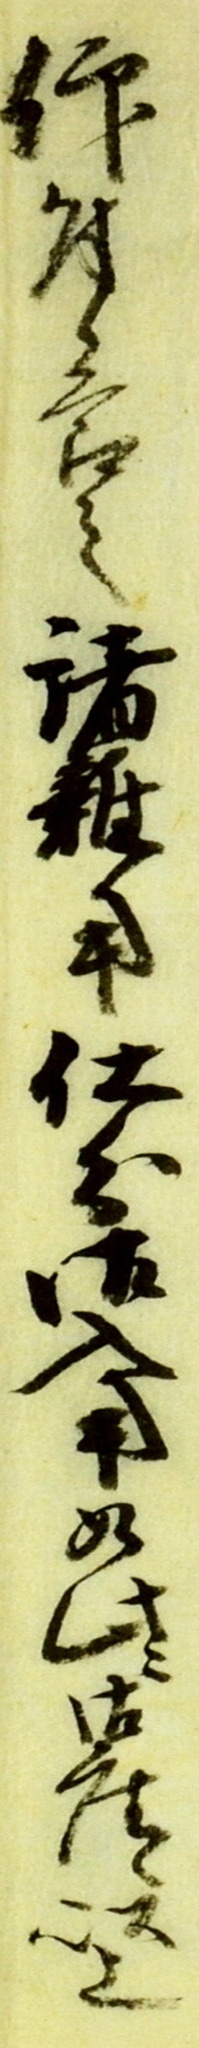仰付候節之諸雑用仕分御入用如此ニ御座候以上
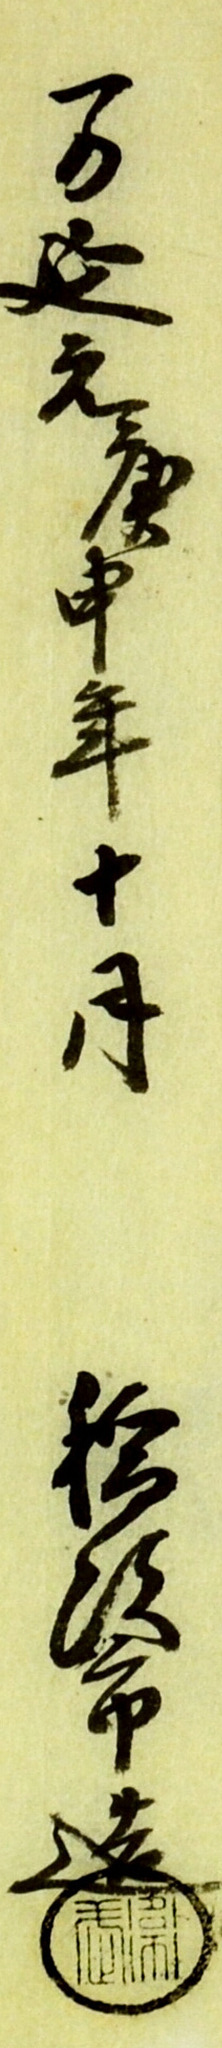万延元庚申年十月稲沢市造㊞
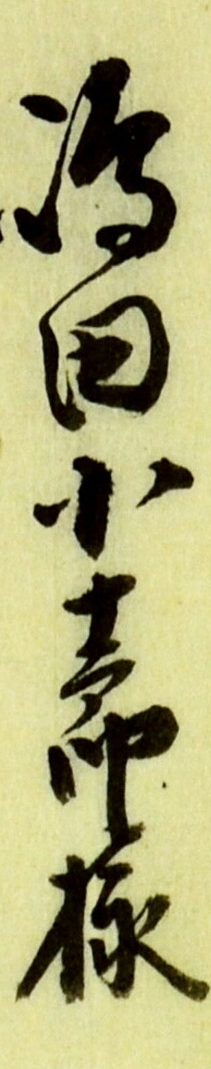嶋田小十郎様
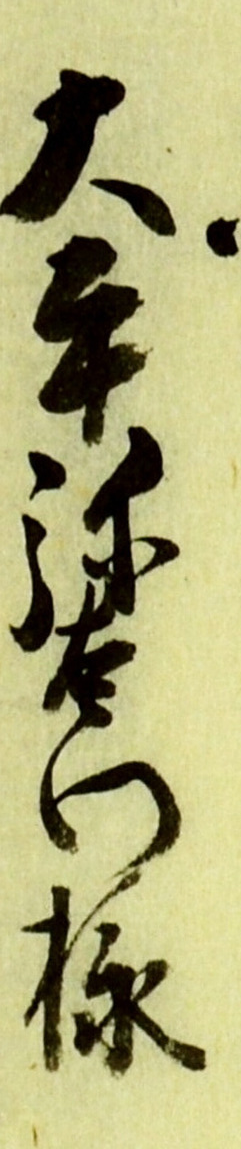大平弥右衛門様

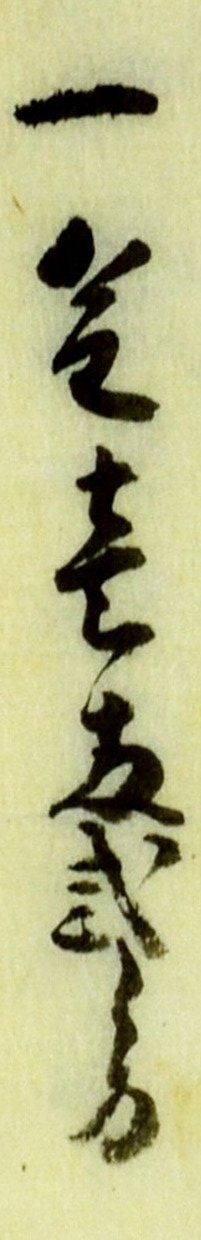〆金壱両弐分ト
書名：覚
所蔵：伊那市立高遠町図書館・合同会社AMANE
